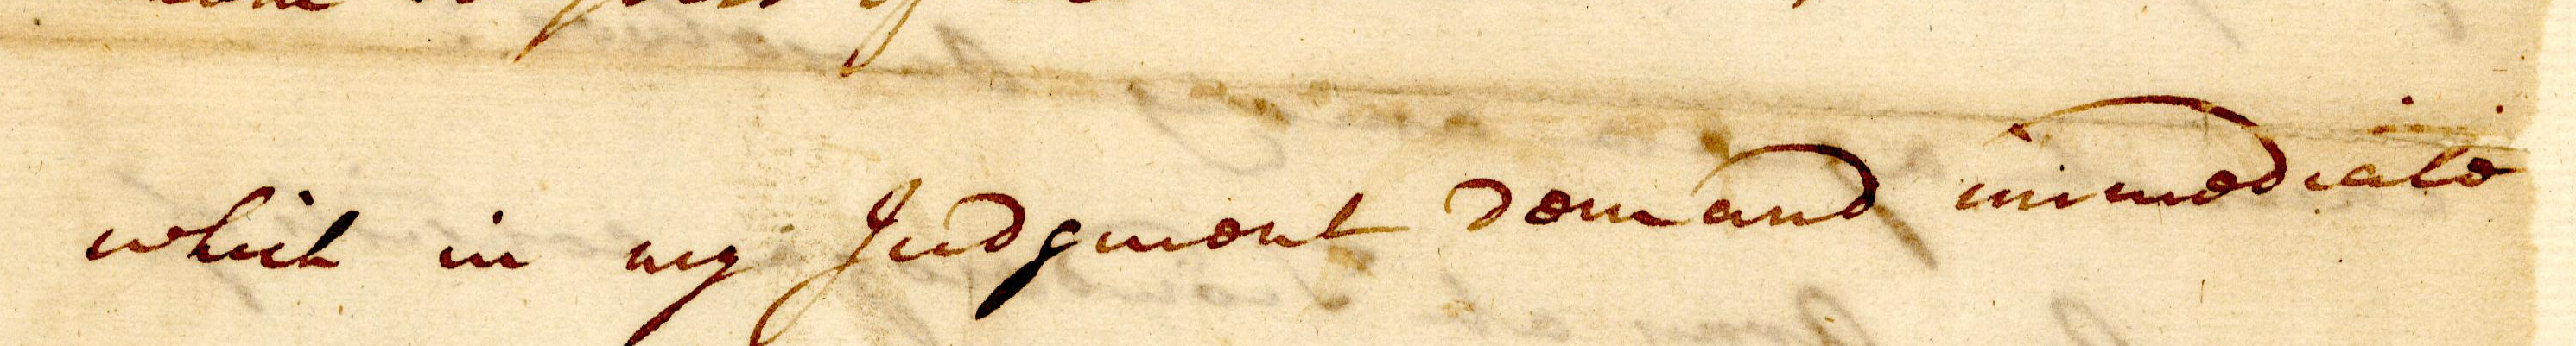which in my Judgement demand immediate
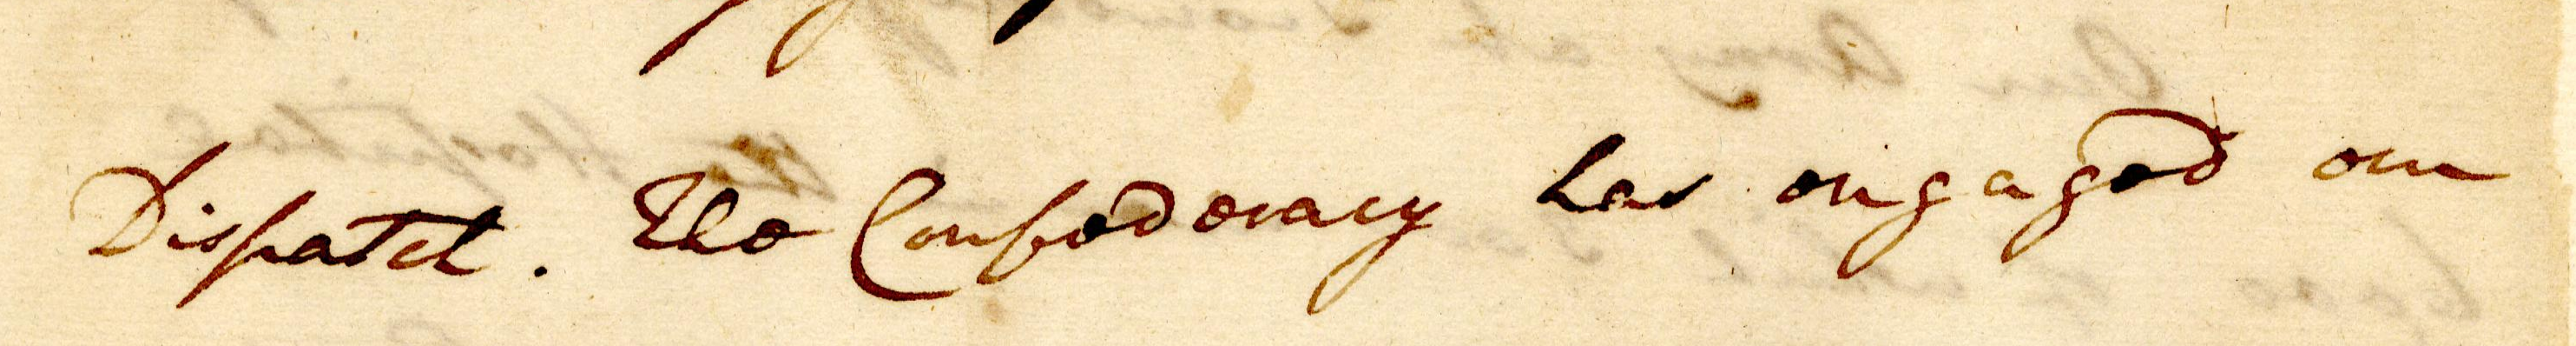Dispatch. The Confederacy has engaged our
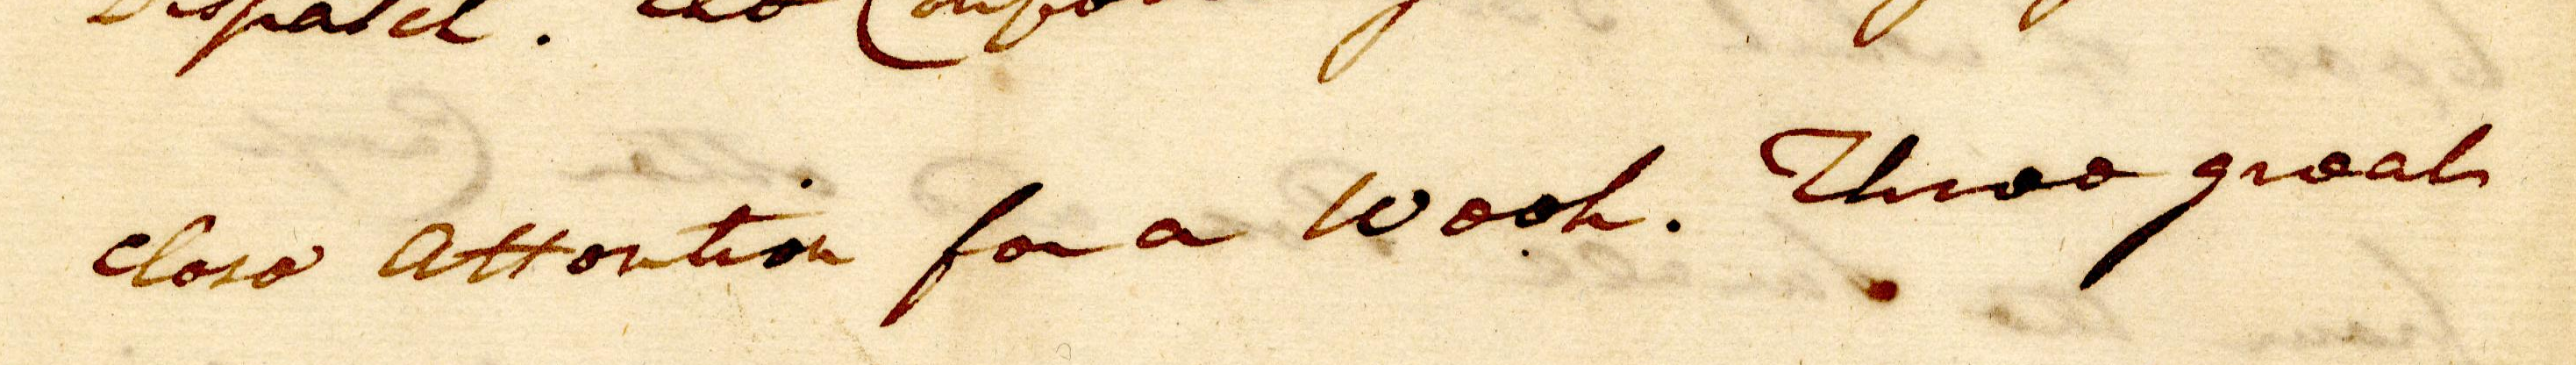close Attention for a Week. These great
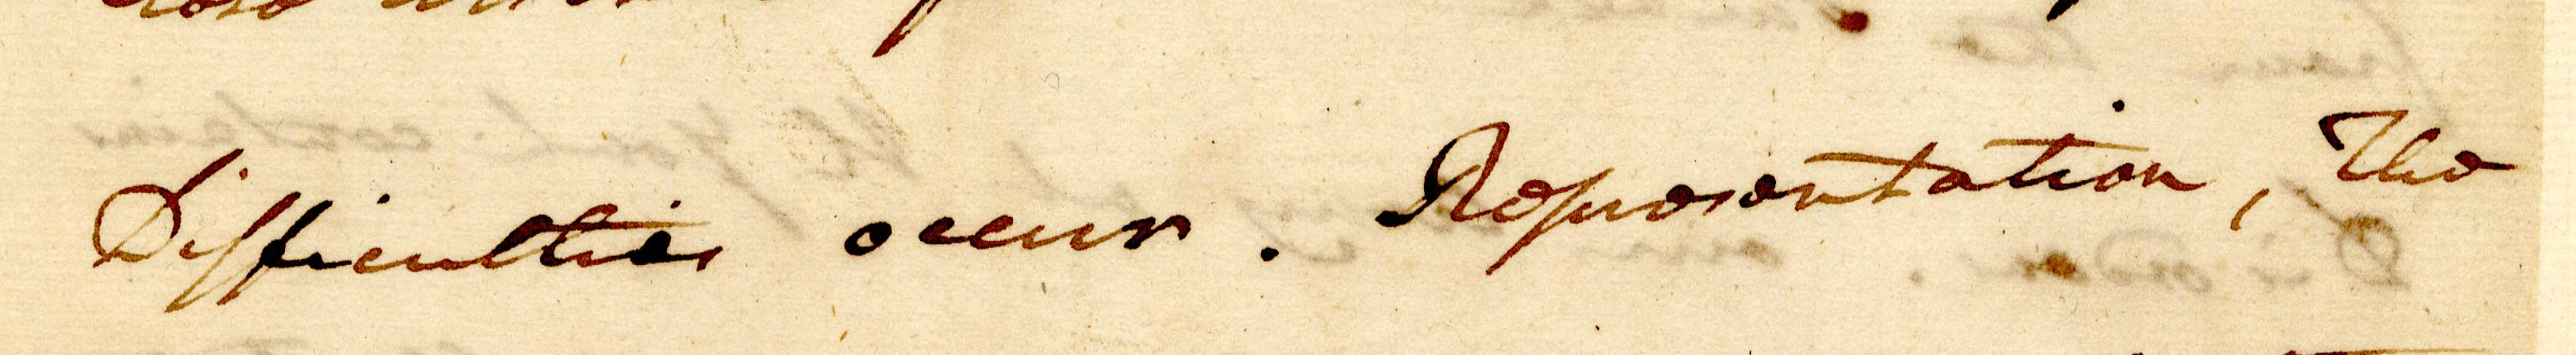Difficulties occur Representation, The
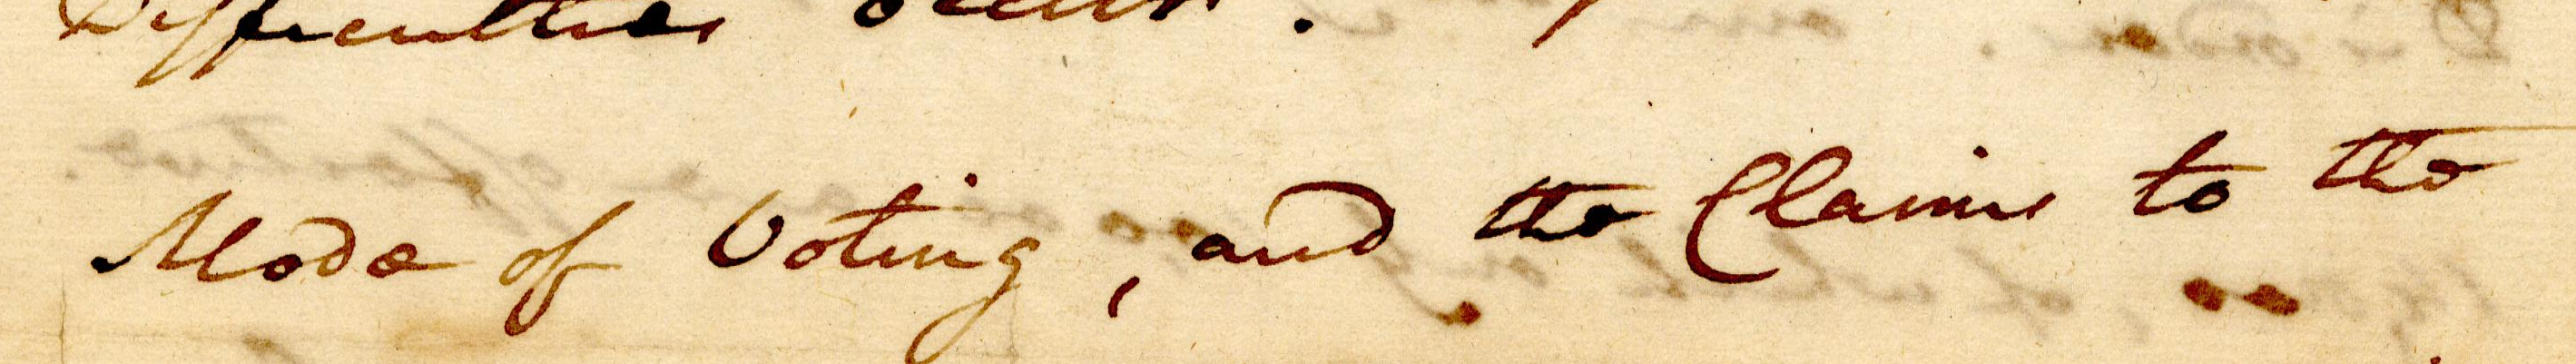Mode of voting, and the Claims to the
